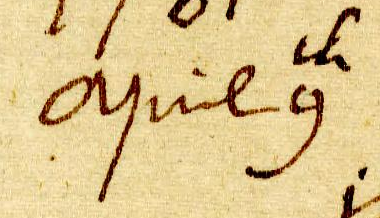April 9^th
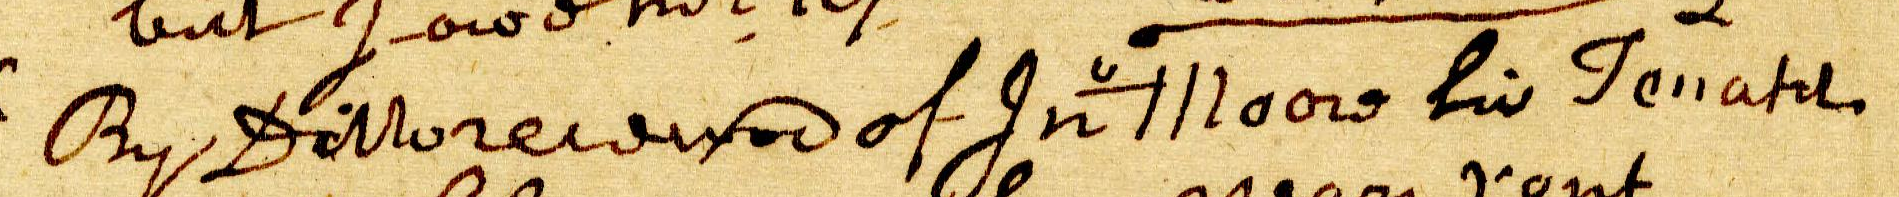By Ditto received of Jn^o Moore his Tenant
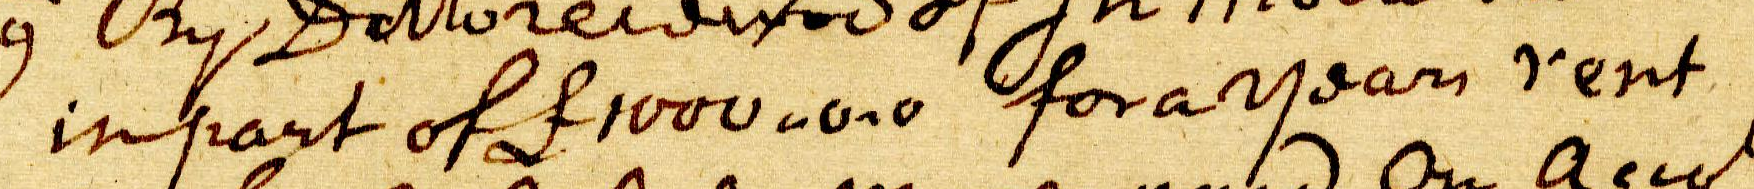in part of £1000.0.0 for a years rent
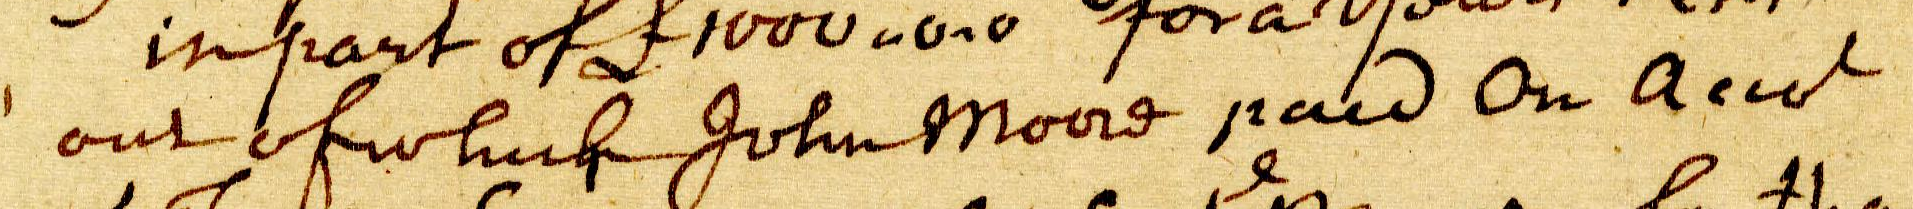out of which John Moore paid On Acco^t
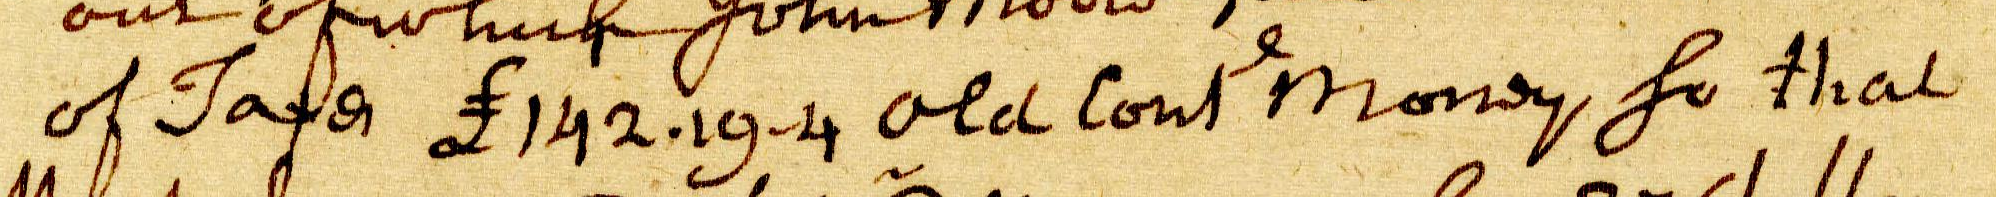of Taxes £142.19-4 Old Cont^l Money so that
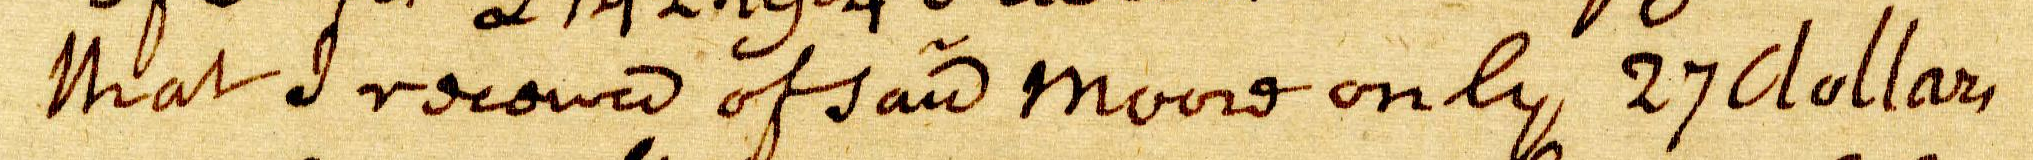that I received of said Moore only 27 dollars
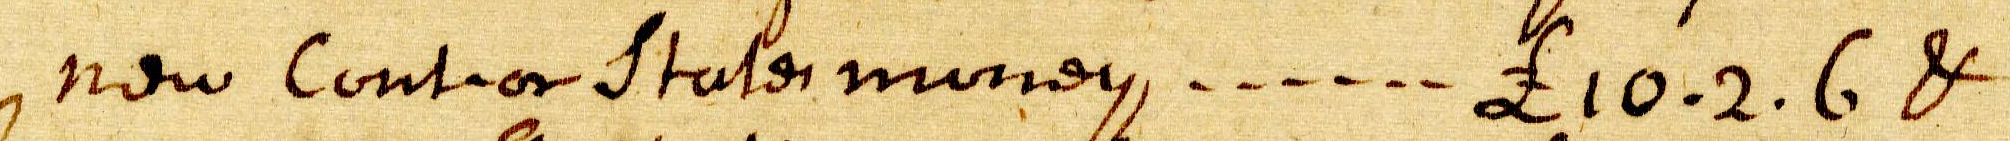now Cont. or States Money...... £10.2.6 &
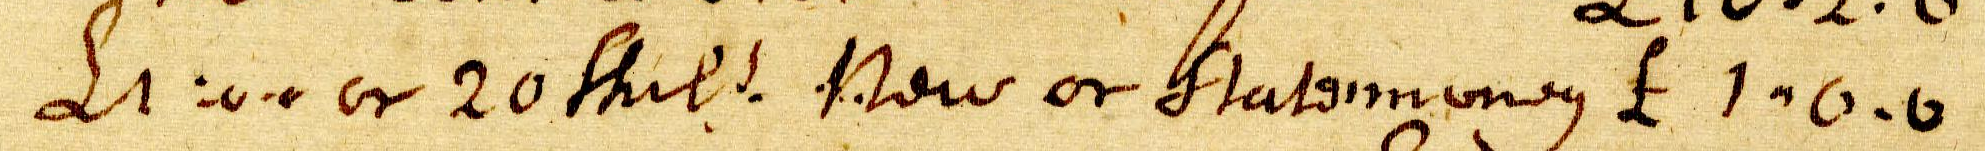£1:0-0 or 20 shil^s. New or States money £ 1..0.6
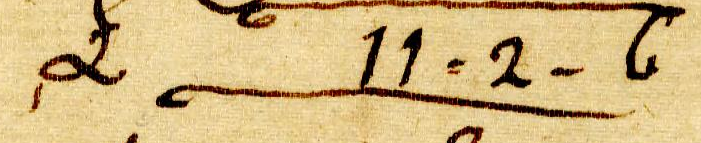£ 11.2.6
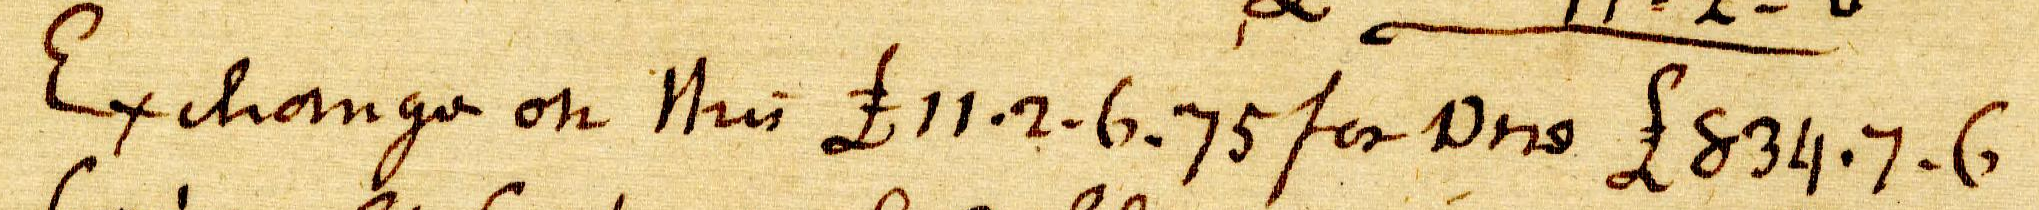Exhcange on this £11.2.6.75 for One £834:7.6
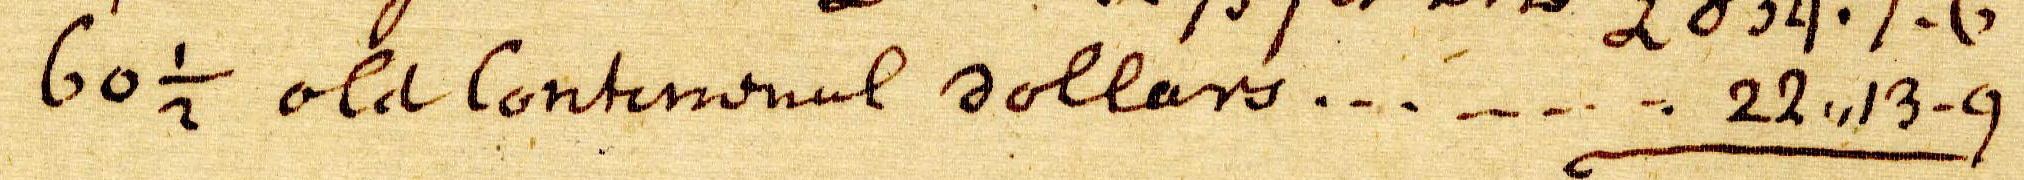60 1/2 old Continental dollars........ 22..13.9
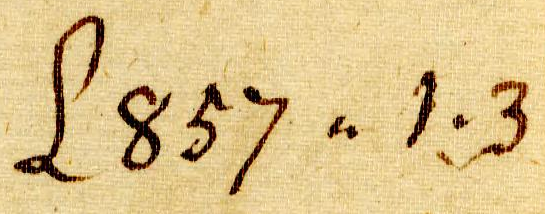£857..1.3
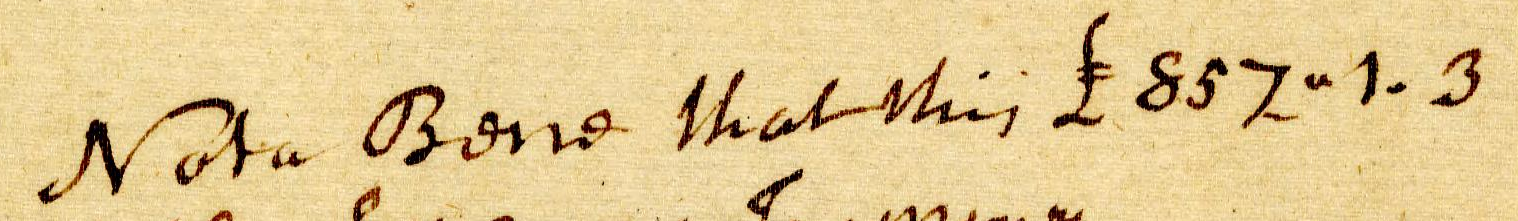Note Bene that this £857,,1. 3
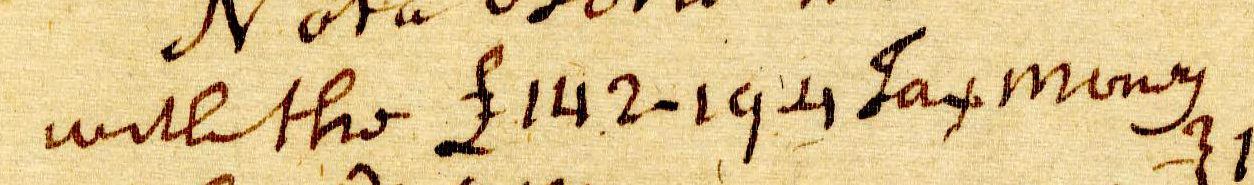with the £142-19-4 Tax Money
